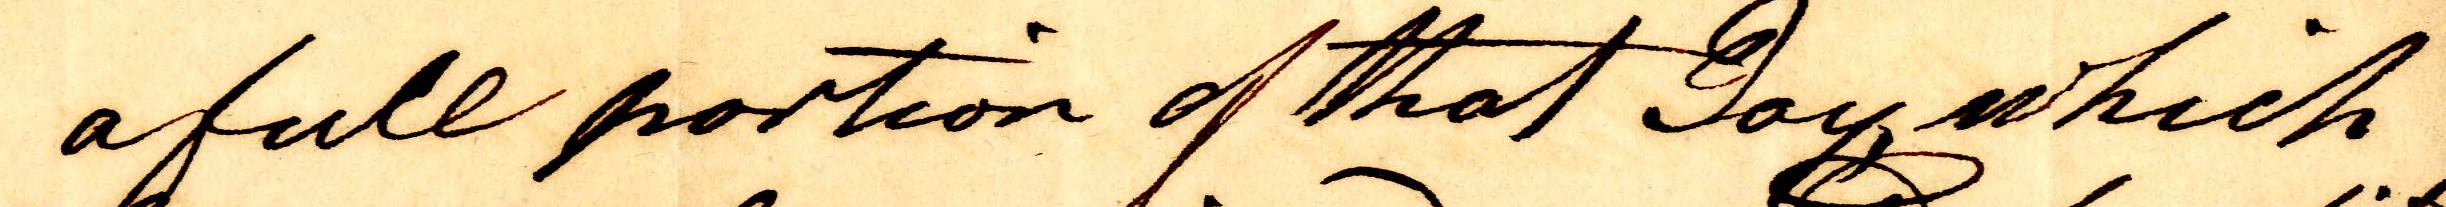a full portion of that Joy, which
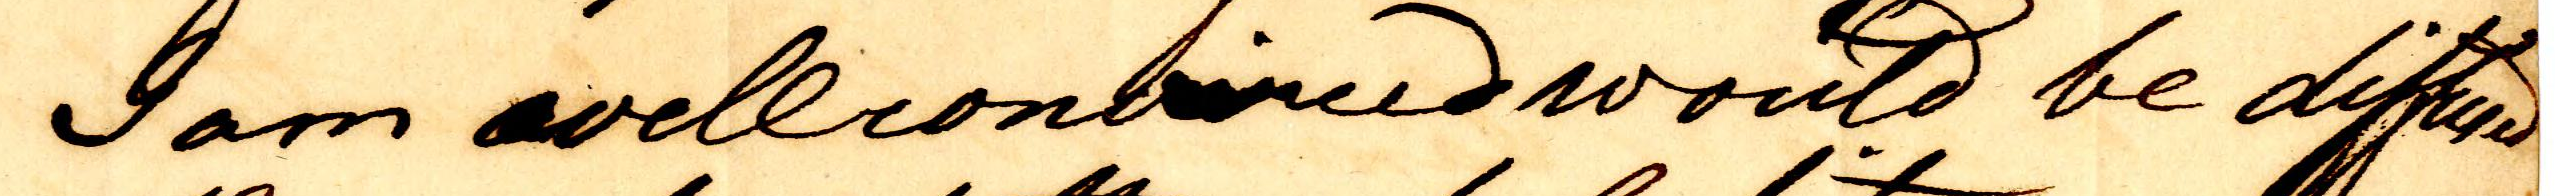I am well convinced would be diffused
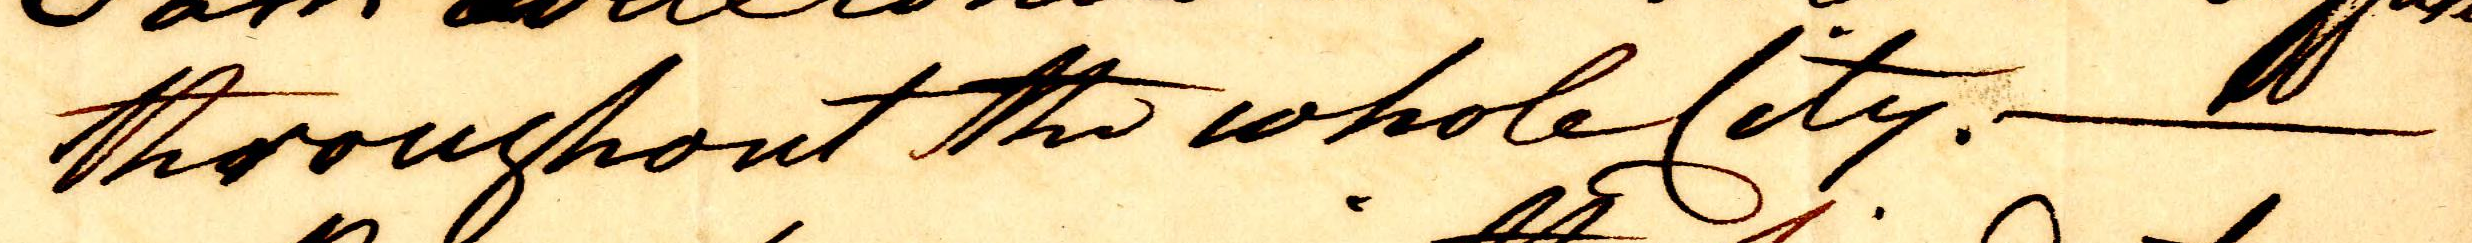throughout the whole City.-
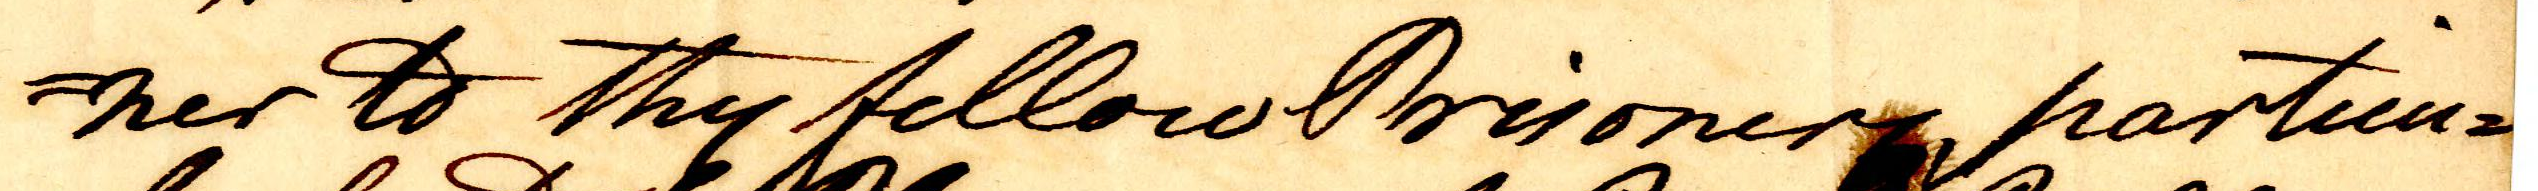-ner to thy fellow Prionsers particu-
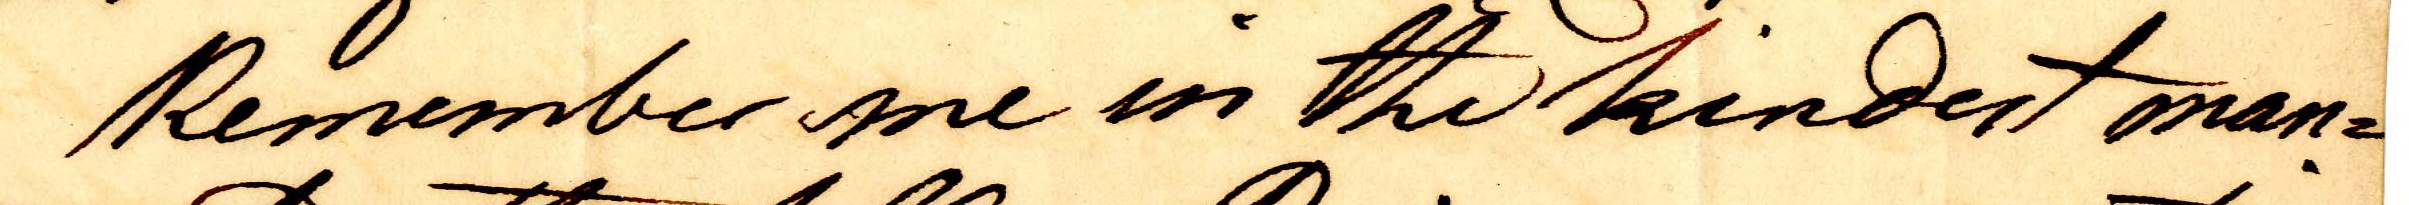Remember me in the kindest man-
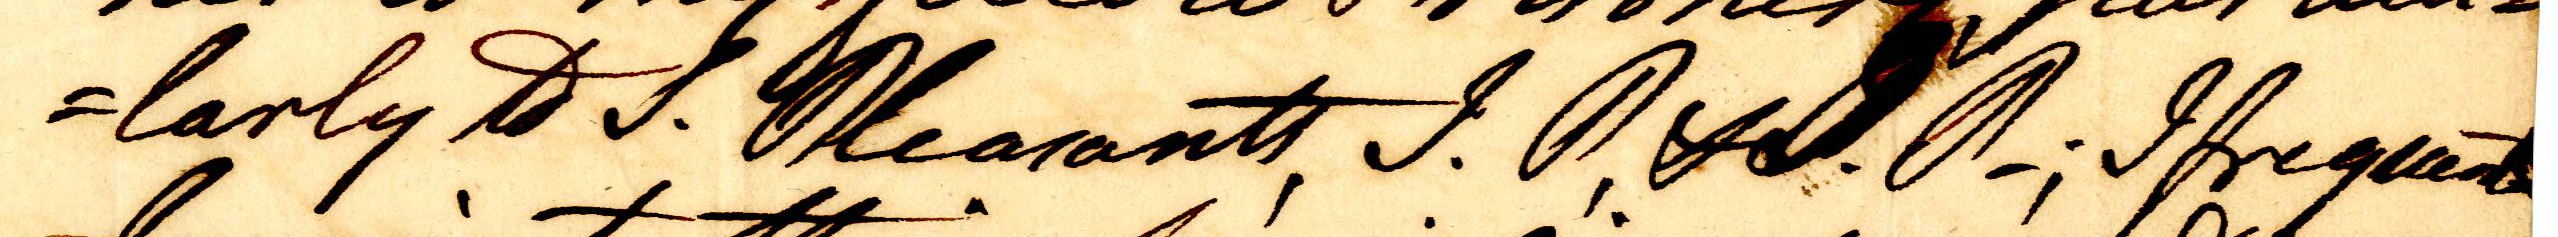-larly to S. Pleasants, J. P, & J. P.; I frequent-
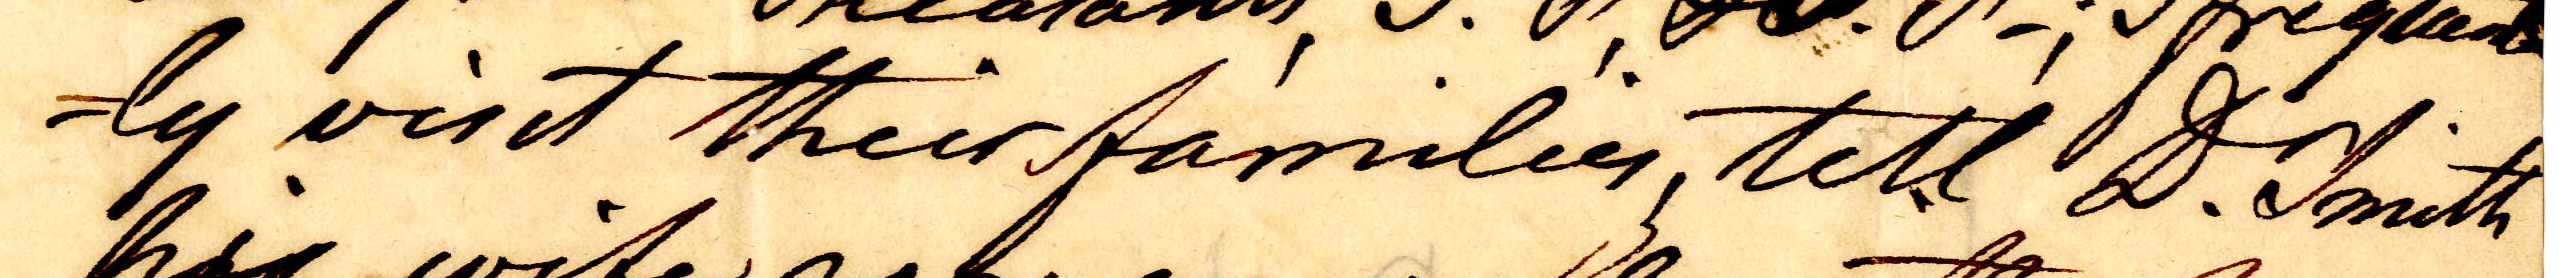-ly visit their families, tell D. Smith
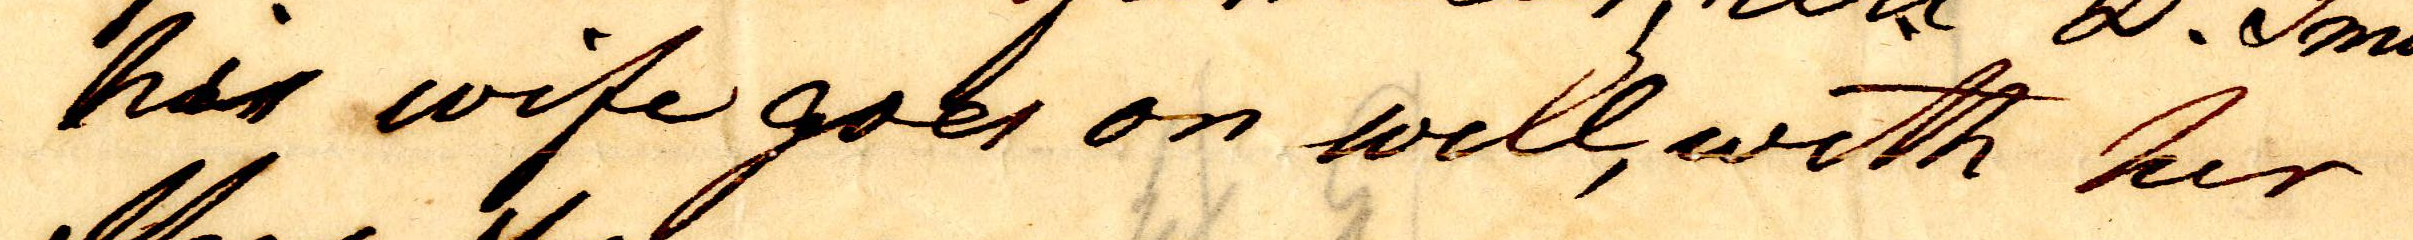his wife goes on well, with her
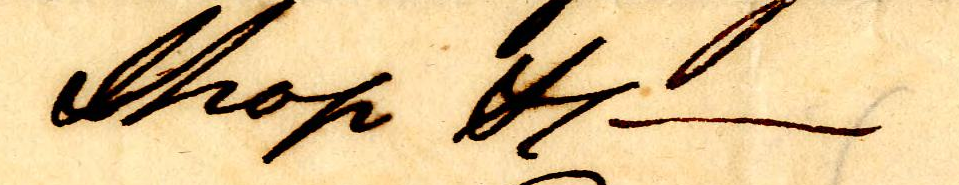shop &c-
